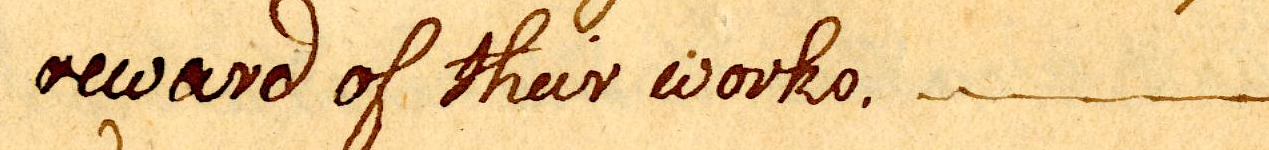reward of their works.-
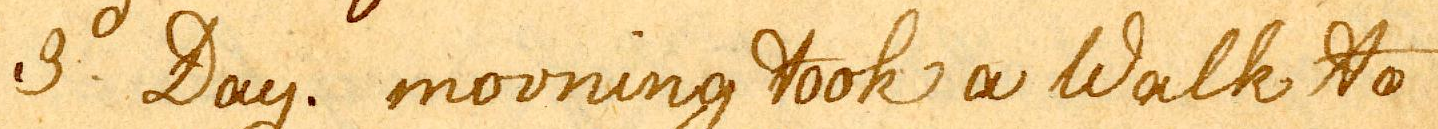3^d Day. morning took a Walk to
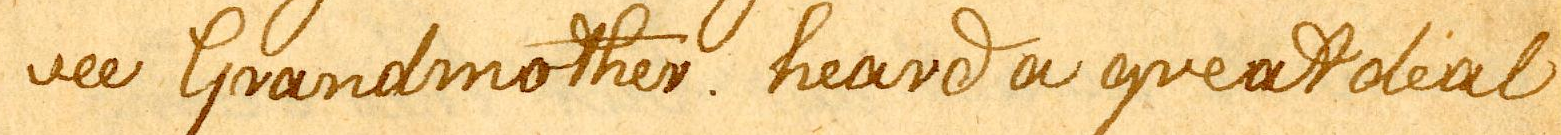see Grandmother. heard a great deal
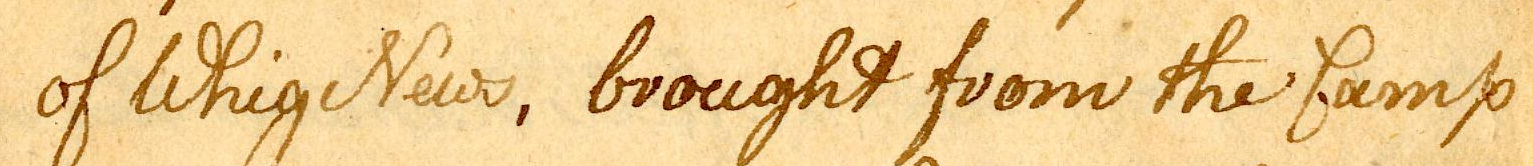of Whig News, brought from the Camp
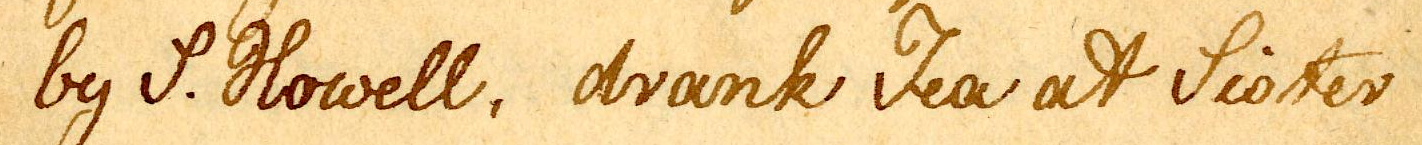by S. Howell, drank Tea at Sister
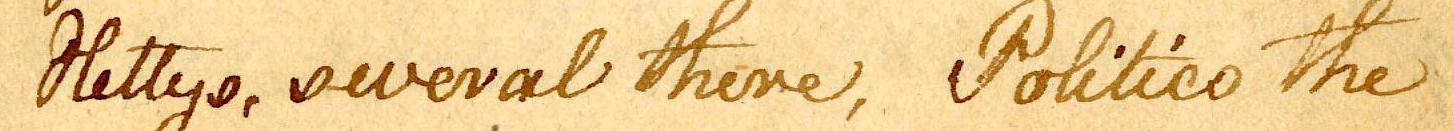Hettys, several there, Politics the
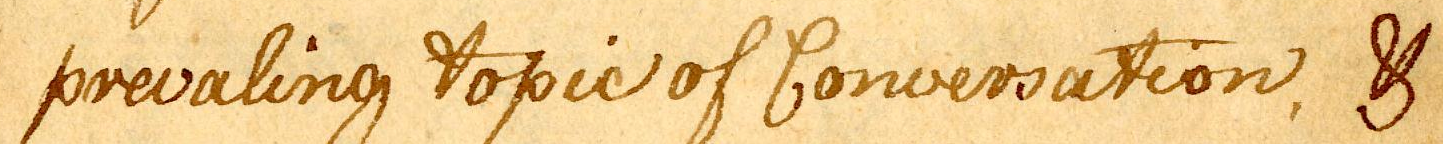prevaling topic of Conversation, &
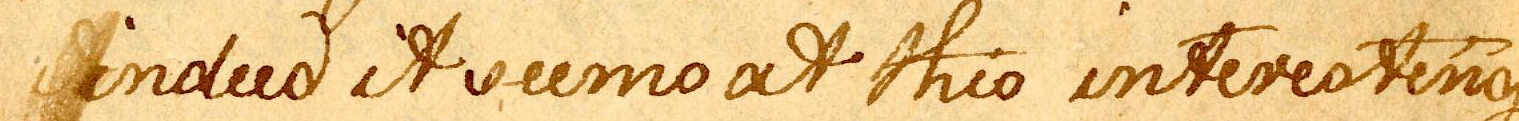indeed it seems at this interesting
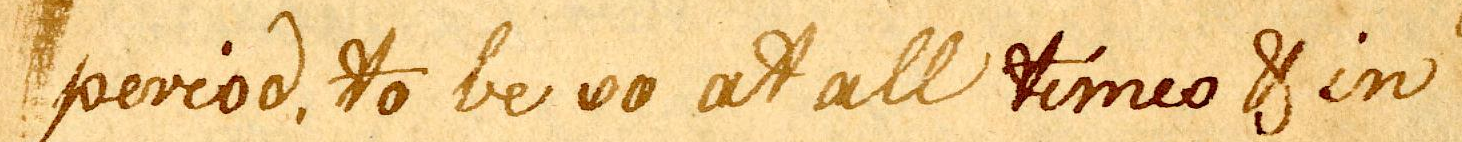period, to be so at all times & in
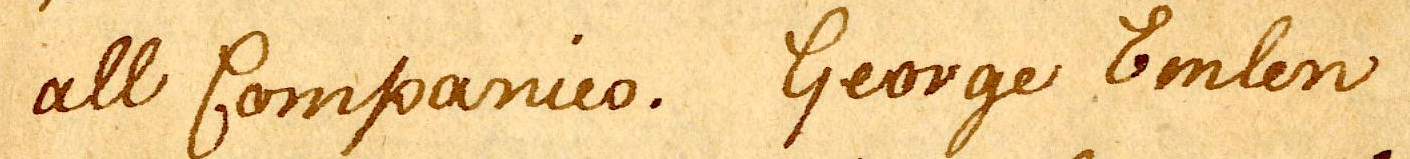all Companies. George Emlen
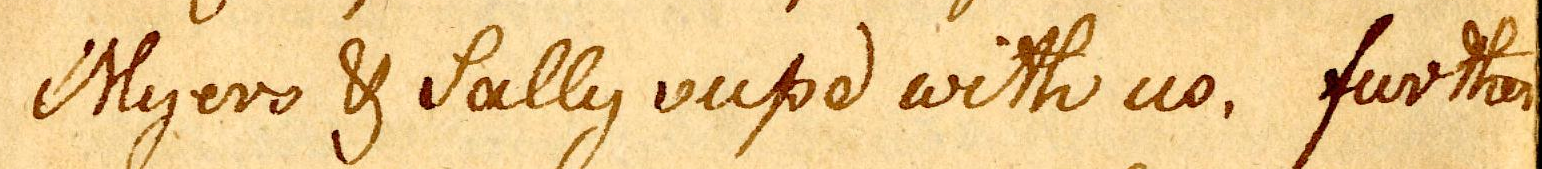Myers & Sally supd with us, further
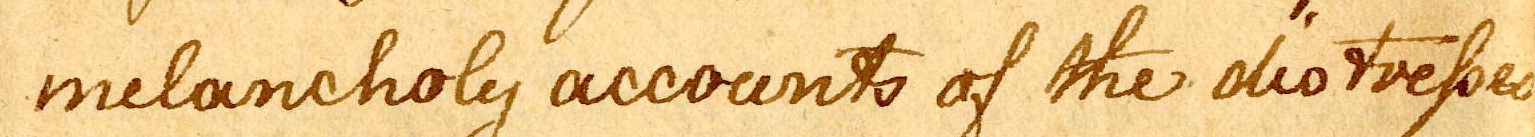melancholy accounts of the distresses
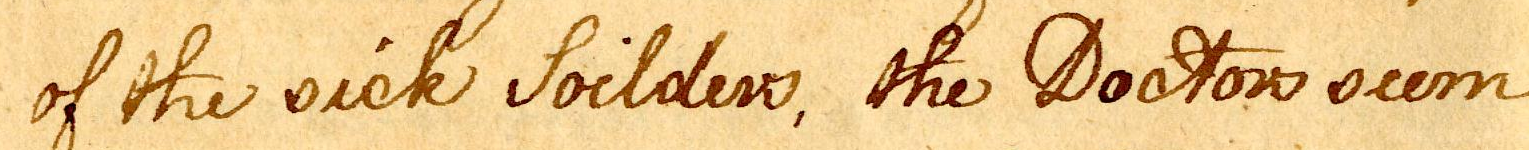of the sick Soilders, the Doctors seem
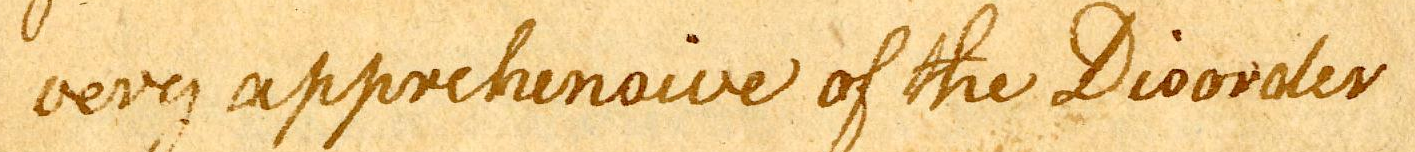very apprehensive of the Disorder
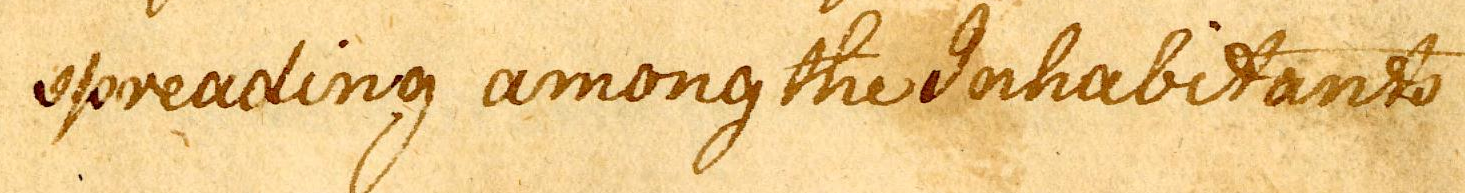spreading among the Inhabitants
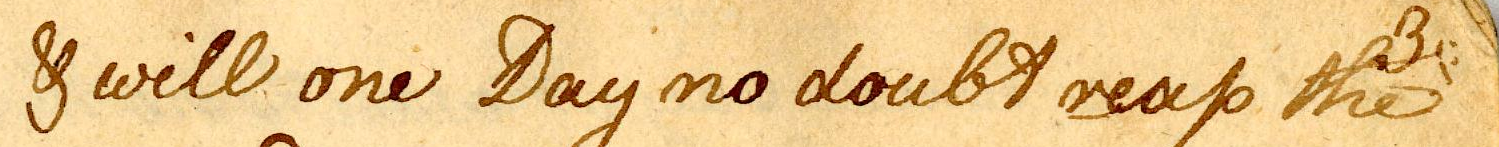& will one Day no doubt reap the
